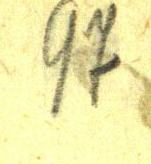97
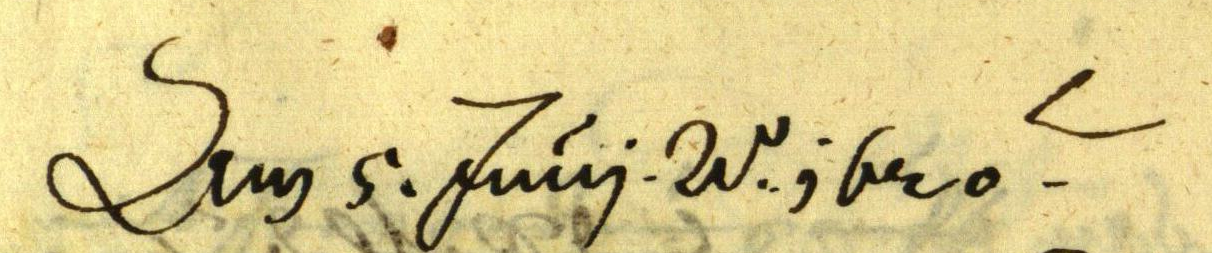Am 5. Jūnj. Ao: 1620.t
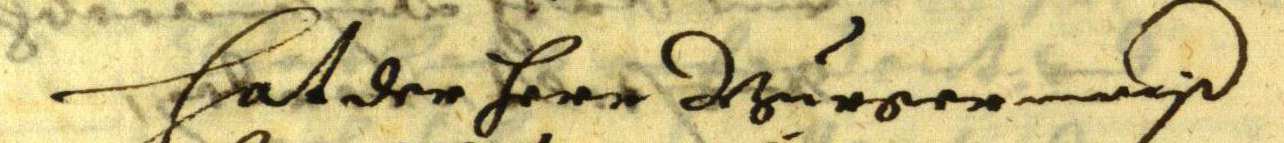hat der herr Būrgermaist
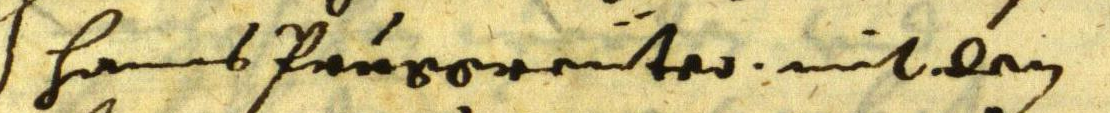hanns Prūggreüter. mit den
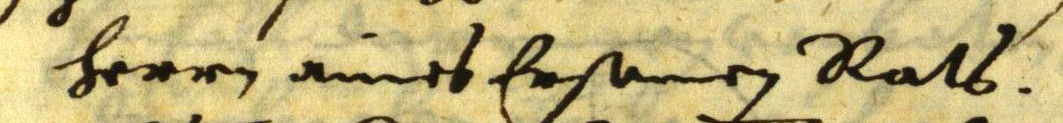herrn aines Ersamen Rats.
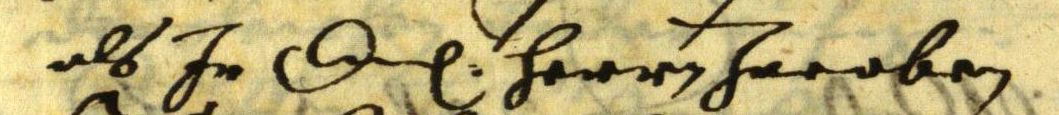als Ir Gn: herrn Jacoben
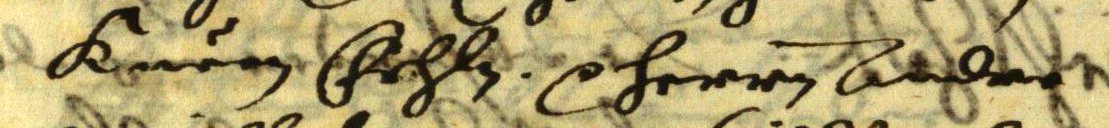Kūeen Frhn. etc herrn Andre
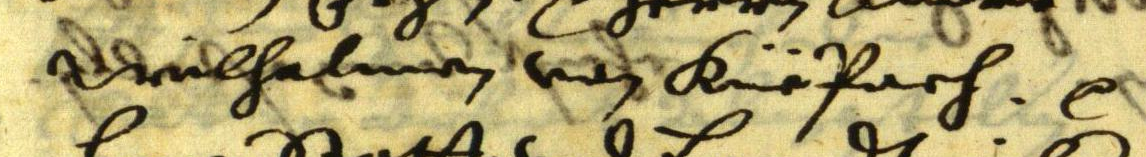Wilhalmen von KüePach. etc
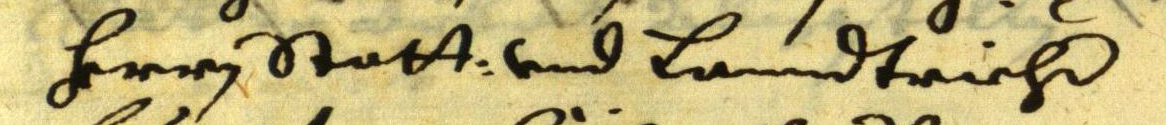herrn Statt: vnd Lanndtricht
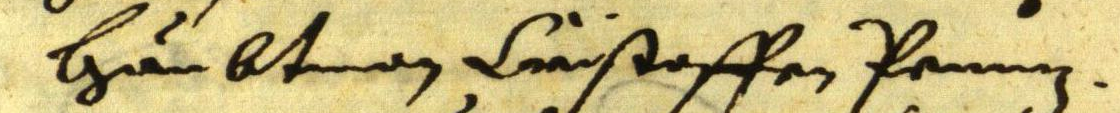Haūbtman Cristoffen Pennz¬
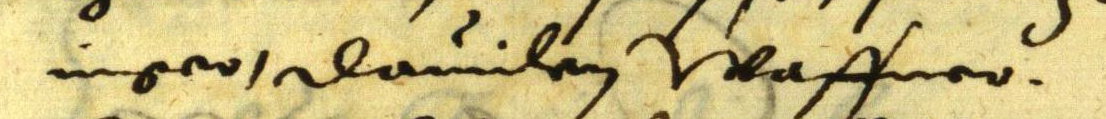inger, Daūiden Waffner.
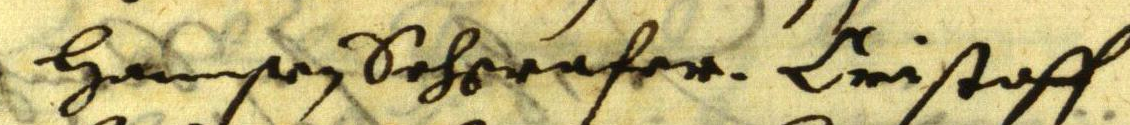Hannsen Schgrafer. Cristoff
